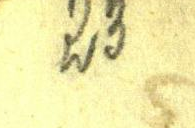23
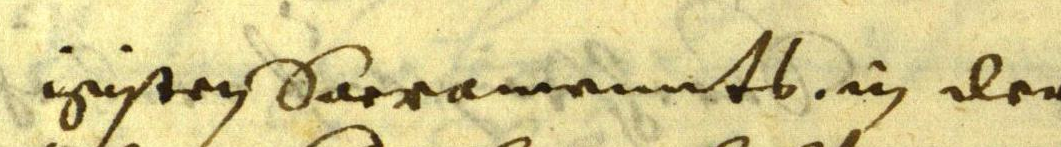igisten Sacraments. in der
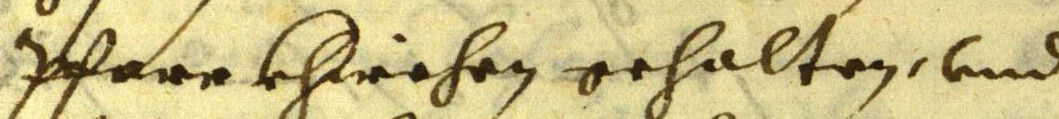Pfarrkhirchen gehalten, vnd
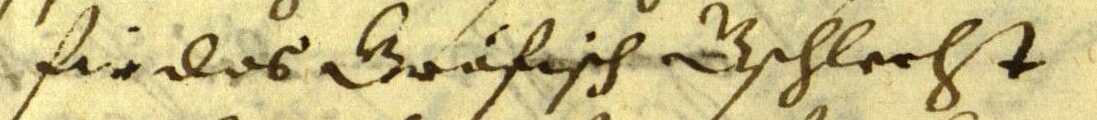fir das Gräfisch Gschlecht
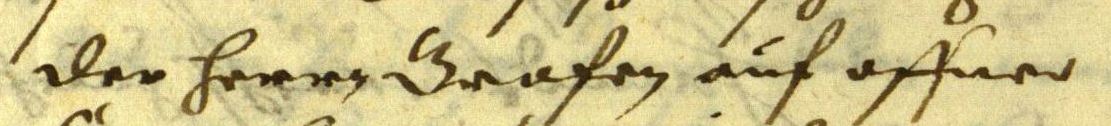der herrn Grafen aūf offner
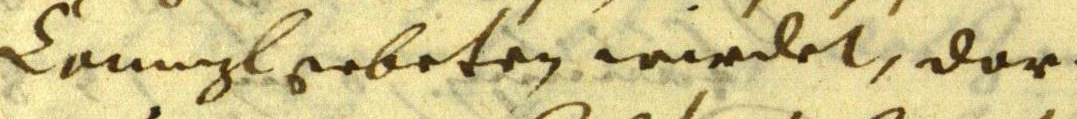Cannzl gebeten wirdet, dar¬
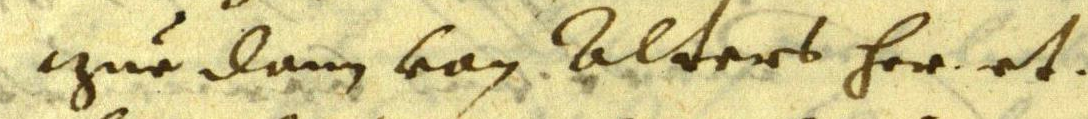zūe dann von Alters her et¬
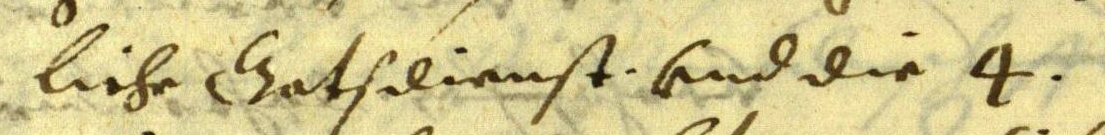liche Gotsdienst. vnd die 4.
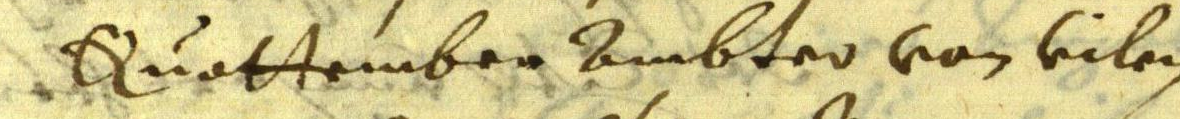Qūattember Ambter von vilen
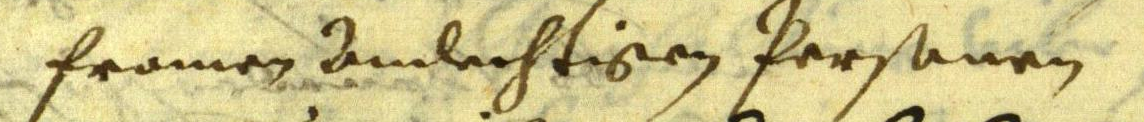fromen Andechtigen Personen
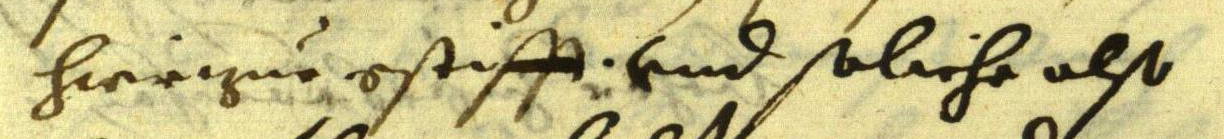hierzūe gstifft. vnd soliche also
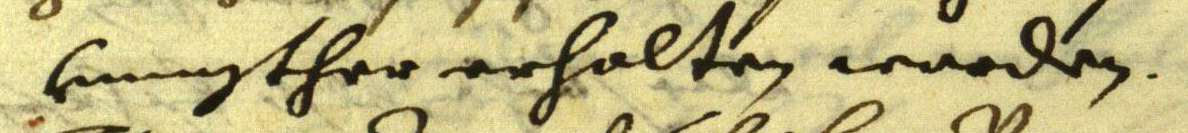vnnzther erhalten worden.
